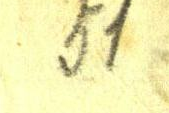51
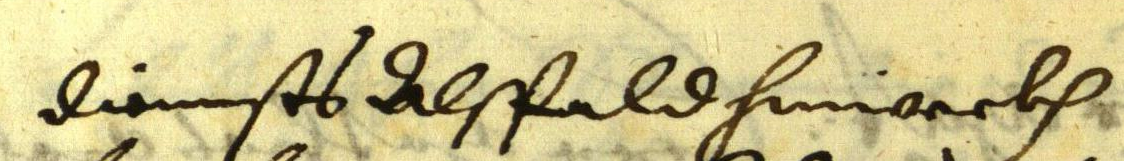diennsts Alspald hinweckh
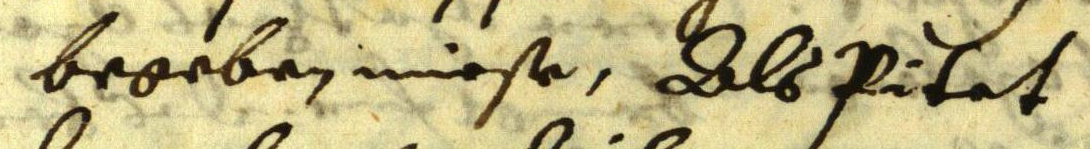begeben mūese, Als Pitet
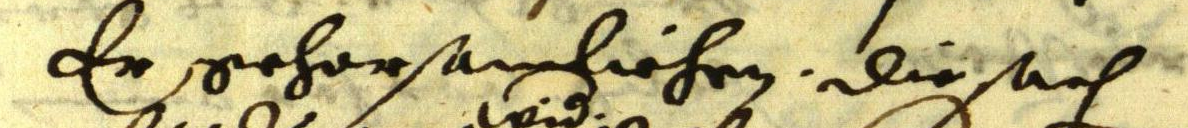Er gehorsamlichen. die sach
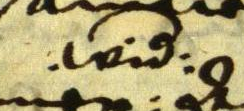.wid:
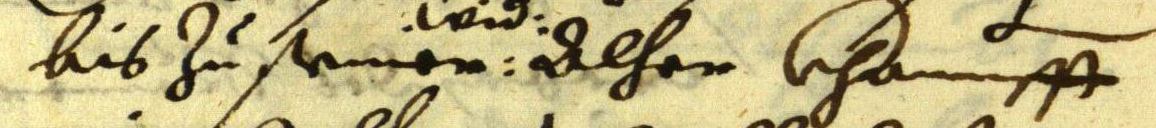bis Zū seiner : Alher Khonnfft
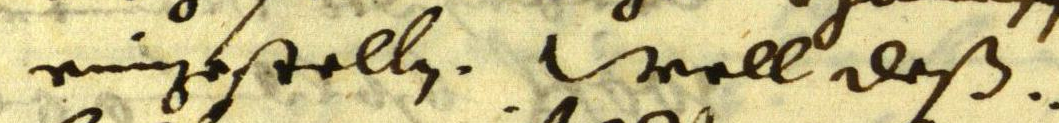einzestelln. Well deß¬
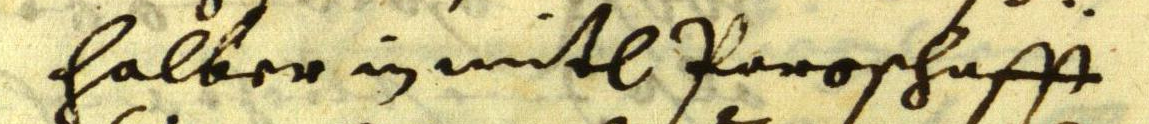halber in mitl Porgschafft
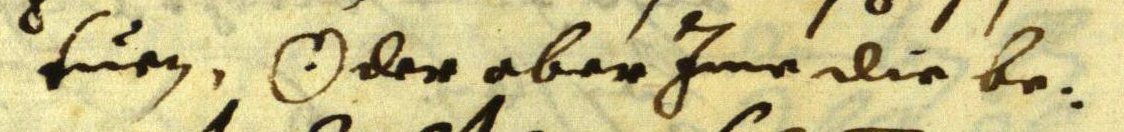tūen, Oder aber Ime die be¬
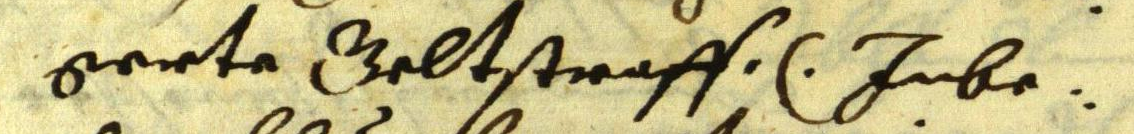gerte Geltstraff .(.Inbe¬
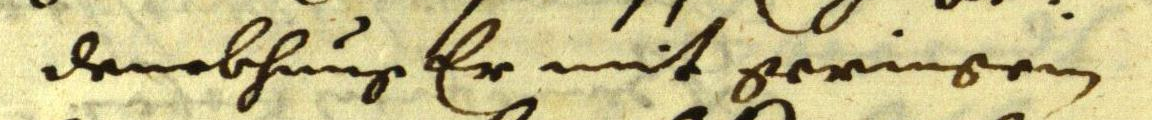denckhūng Er mit geringem
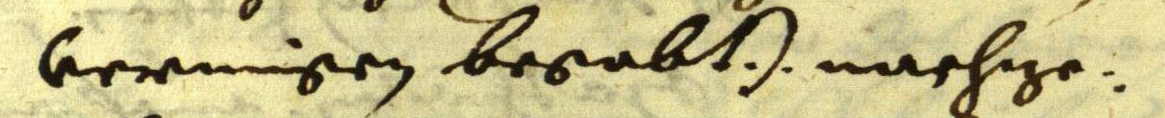vermigen begabt.). nachze¬
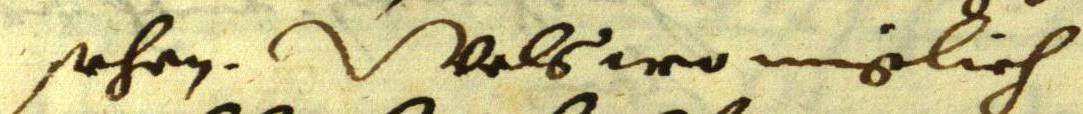sehen. Wels wo miglich
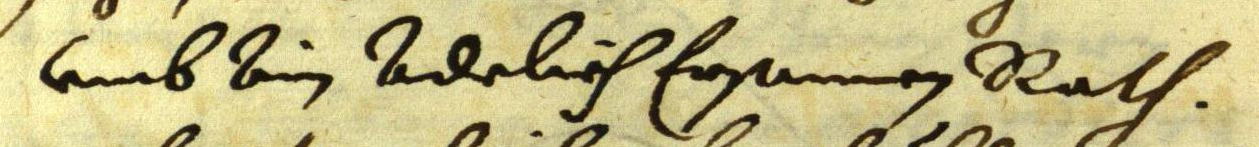vmb Ain Adelich Ersamen Rath.
